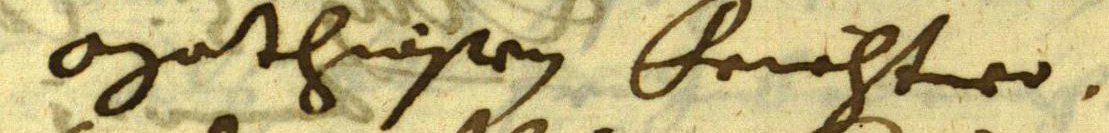Mathiasen Feichtner.
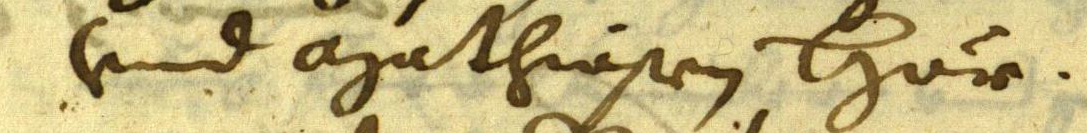vnd Mathiasen Hōr¬
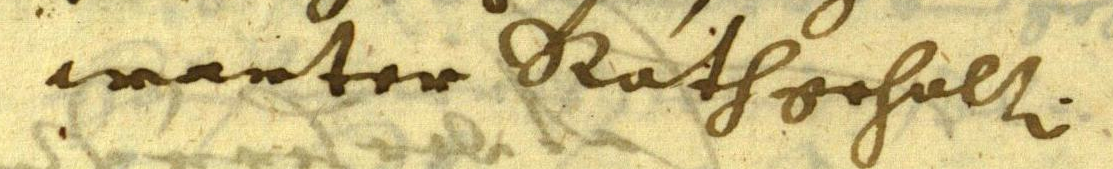warter Rath gehalt.
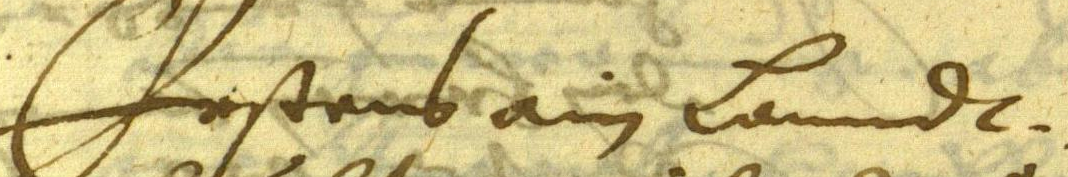Erstens ain Lanndt¬
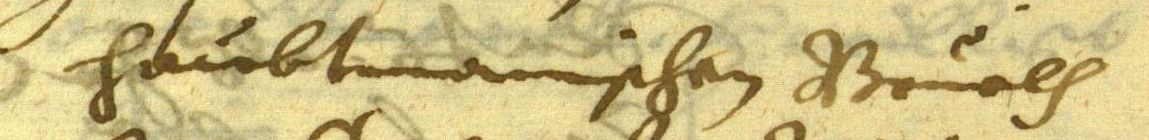haūbtmanischen Beūelh
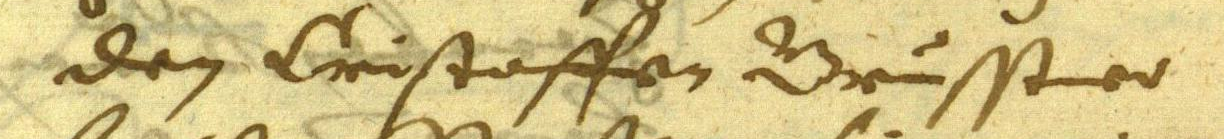den Cristoffen Grūsstner
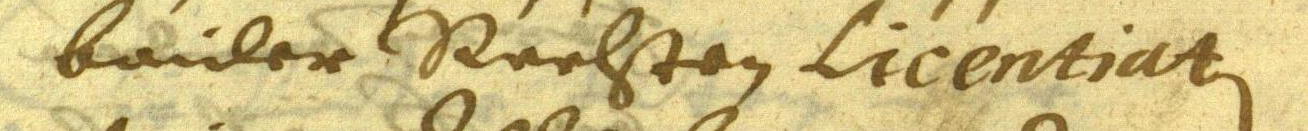baider Rechten Licentiat
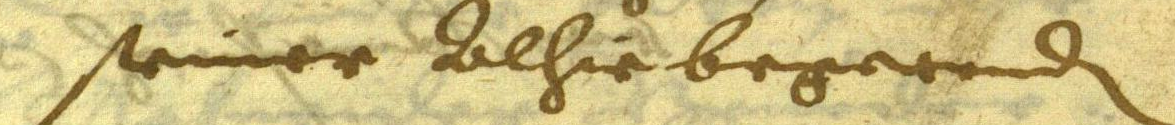seiner Alhie begerend
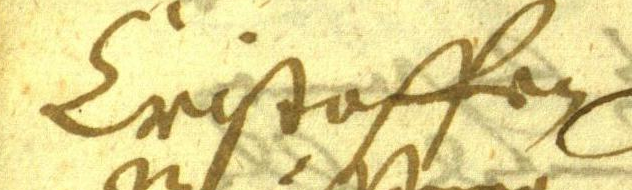Cristoffen
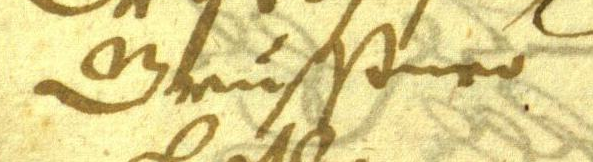Grūsstner
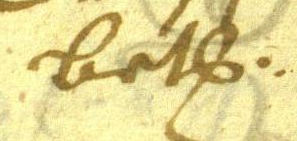bet:
